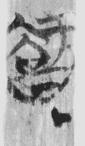智
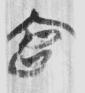官
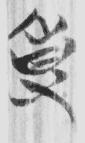事
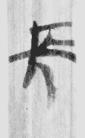長
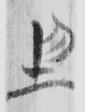廷
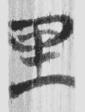里
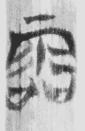霝
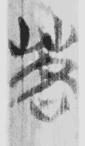茖
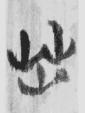卉
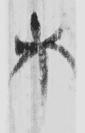木
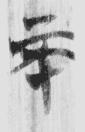不
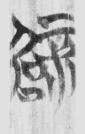辟
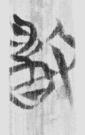敢
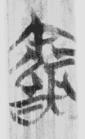{尒䎽}
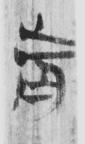歬
